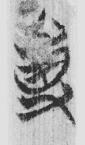尃
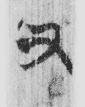又
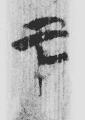下
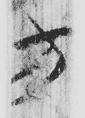方
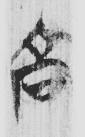高
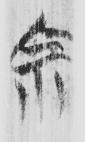宗
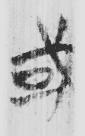或
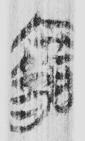{尒䎽}
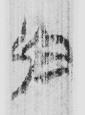於
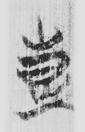彭
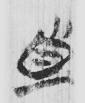且
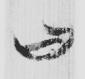曰
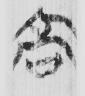高
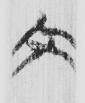文
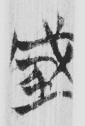城
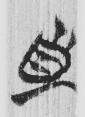且
